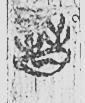晉
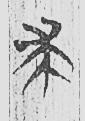求
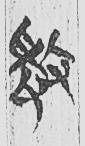{爰攴}
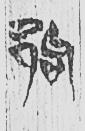邭
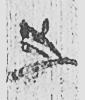之
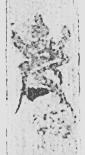尅
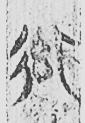率
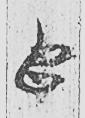𠂤
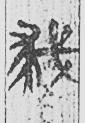{求戈}
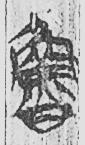魯
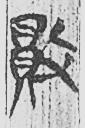敗
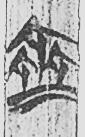齊
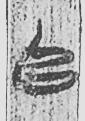𠂤
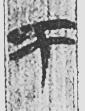于
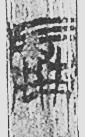{石𣏟}
